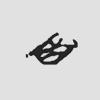亯
